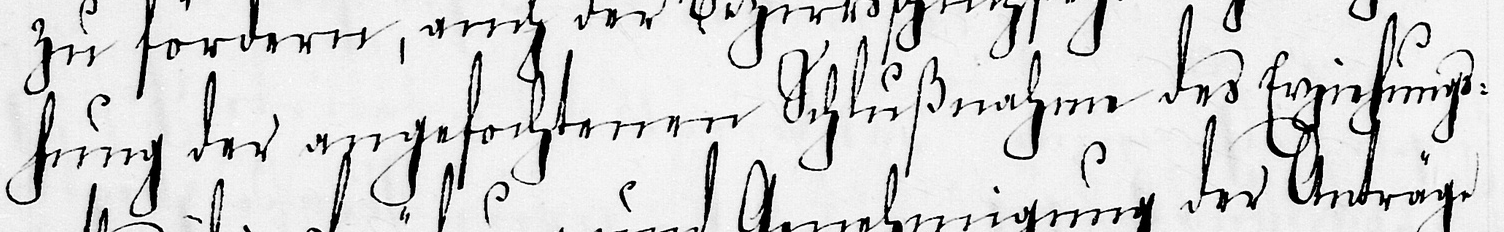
hung der angefochtenen Schlußnahme des Erziehungs¬
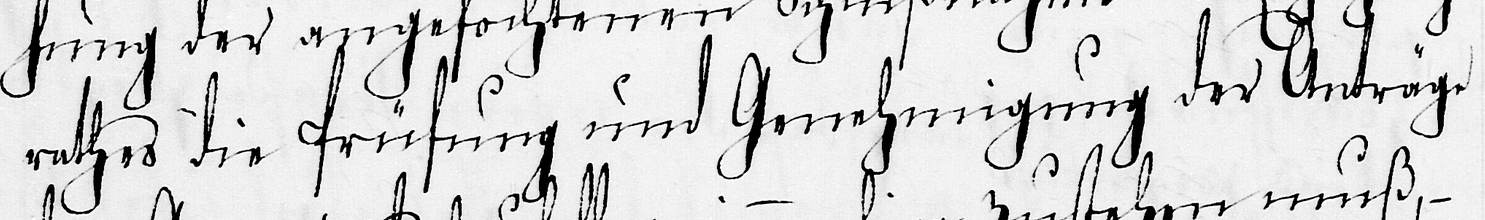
rathes die Prüfung und Genehmigung der Anträge
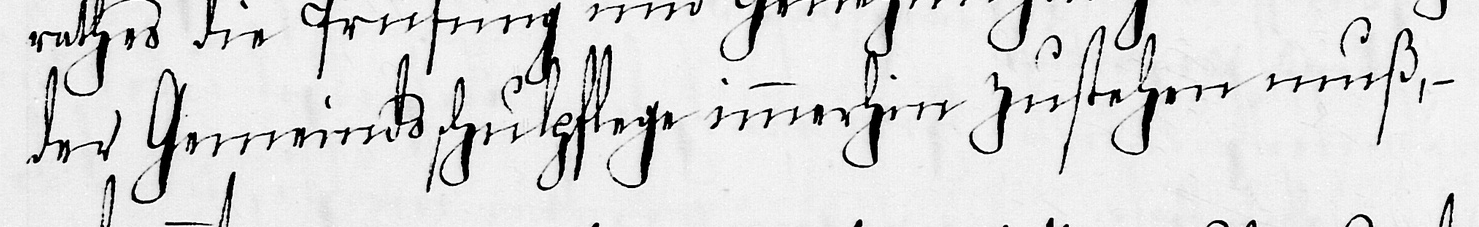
der Gemeindsschulpflege immerhin zustehen muß, –
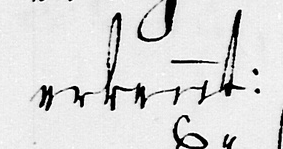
erkennt:
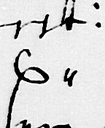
1831.
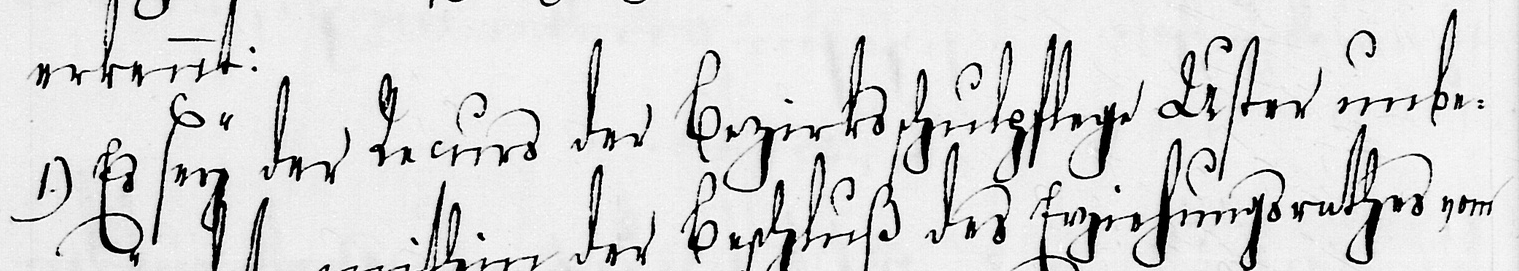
Es sey der Recurs der Bezirksschulpflege Uster unbe¬
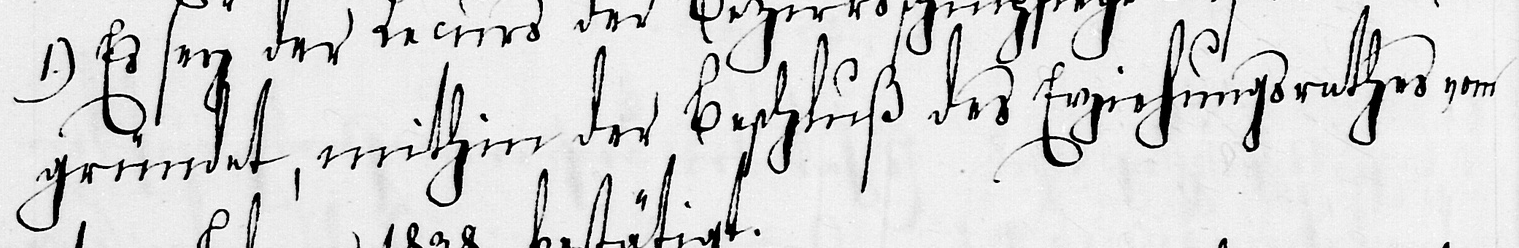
gründet, mithin der Beschluß des Erziehungsrathes vom
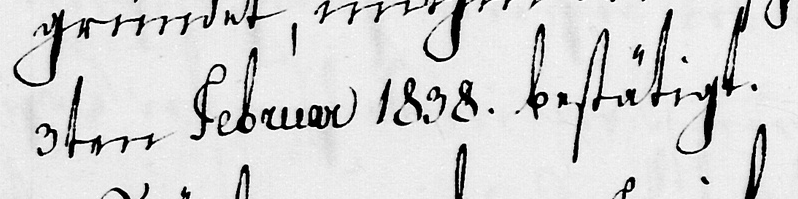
3ten Februar 1839. bestätigt.
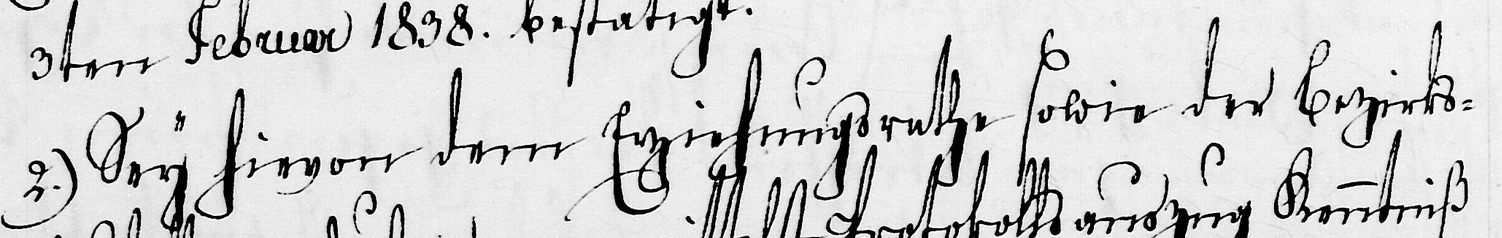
2.) Sey hievon dem Erziehungsrathe sowie der Bezirks¬
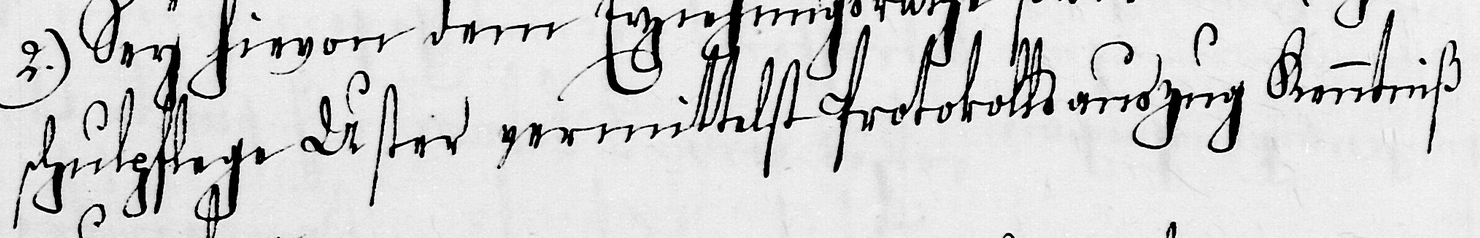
schulpflege Uster vermittelst Protokollsauszug Kenntniß
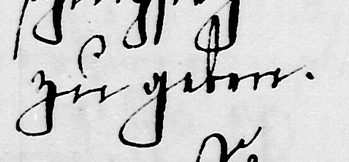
zu geben.
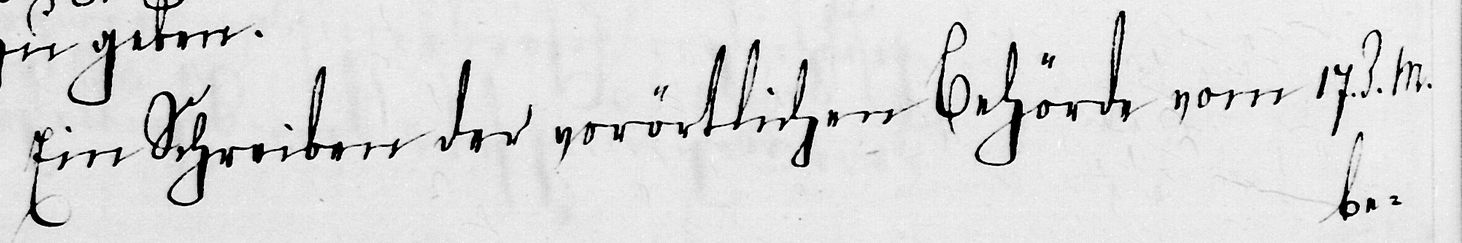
Ein Schreiben der vorörtlichen Behörde vom 17. d.
